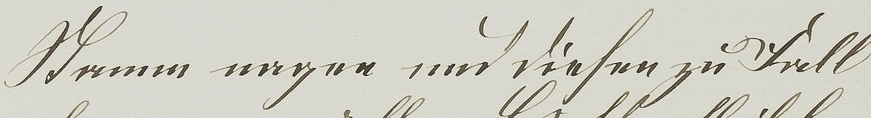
Stamm nagen und diesen zu Fall
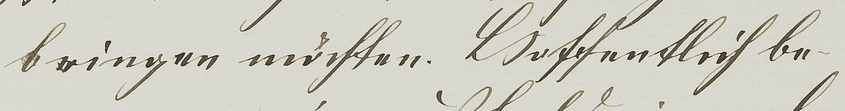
bringen möchten. Hoffentlich be-
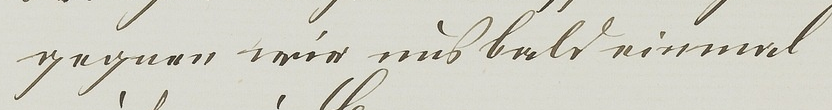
gegnen wir uns bald einmal
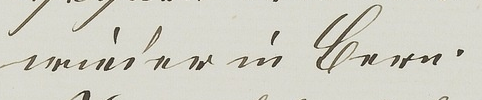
wieder in Bern.
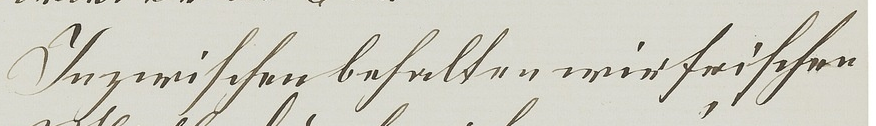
Inzwischen behalten wir frischen
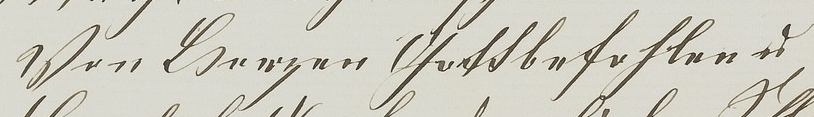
Von Herzen Gottbefohlen u
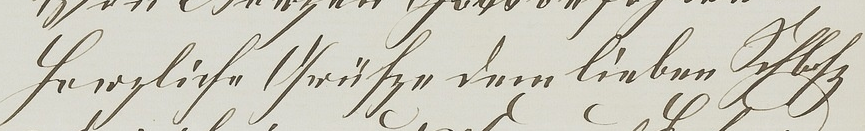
herzliche Grüsze dem lieben Schlosz
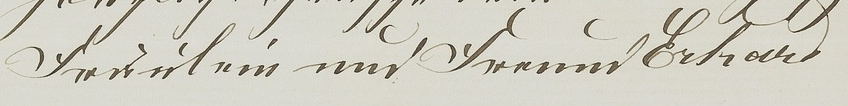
Fräulein und Freund Erhard
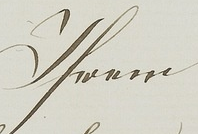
Ihrem
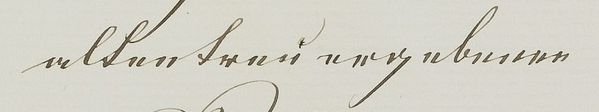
alten treu ergebenen
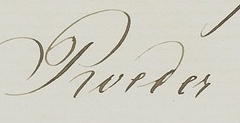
Roeder
